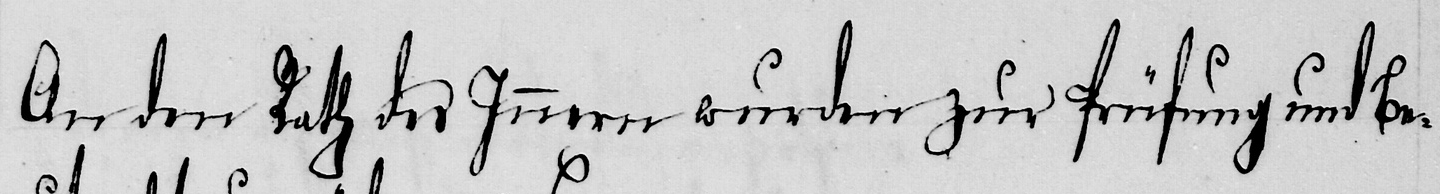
An den Rath des Innern wurden zur Prüfung und Be¬
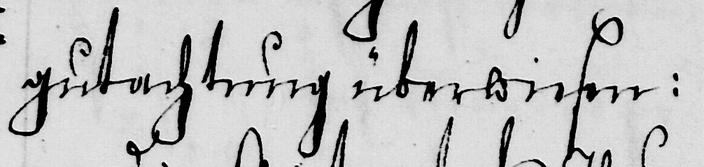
gutachtung überwiesen:
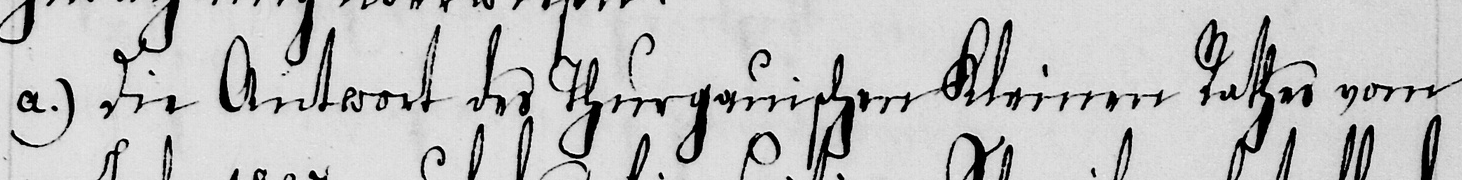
a.) Die Antwort des Thurgauischen Kleinen Rathes vom
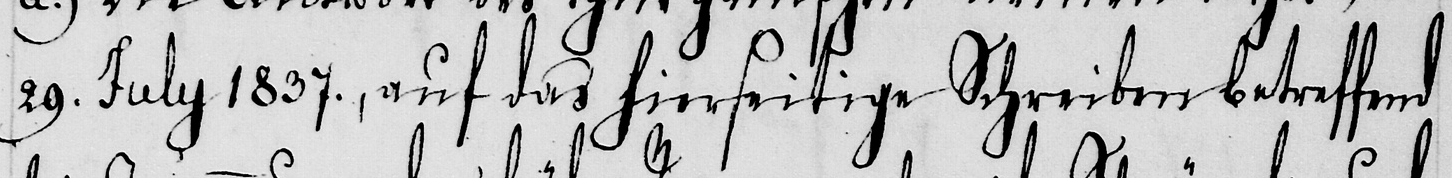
29. July 1837., auf das hierseitige Schreiben betreffend
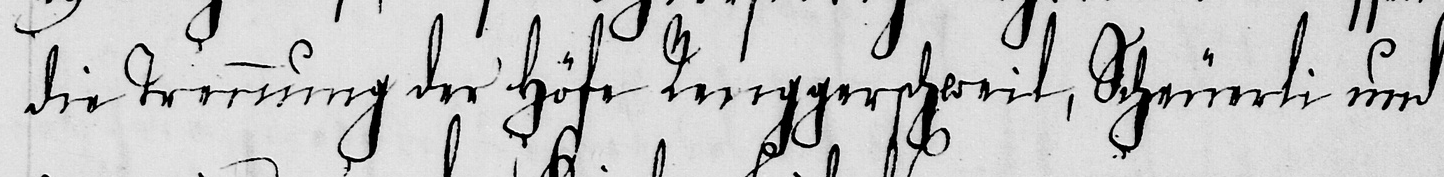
die Trennung der Höfe Renggerschweil, Scheuerli und
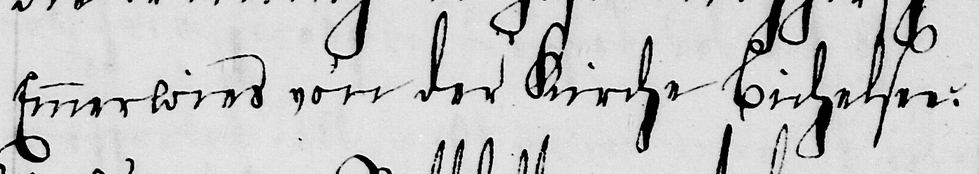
Emmerwies von der Kirche Bichelsee.
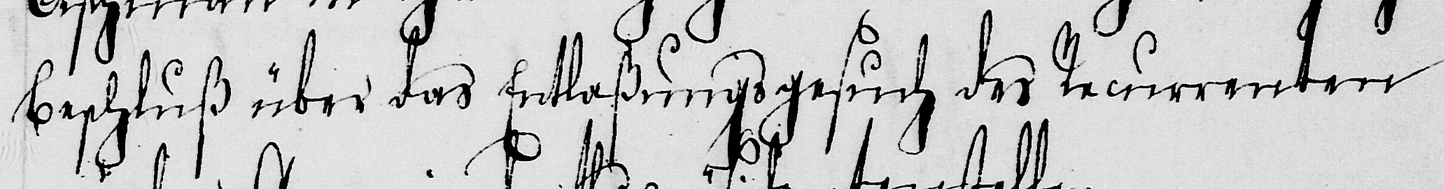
Beschluß über das Entlaßungsgesuch des Recurrenten
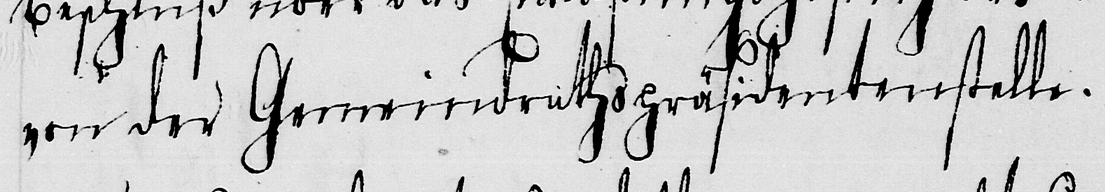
von der Gemeindrathspräsidentenstelle.
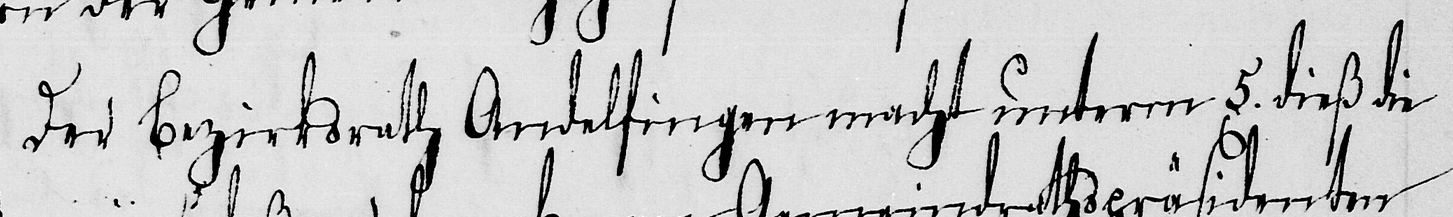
Der Bezirksrath Andelfingen macht unterm 5. dieß die
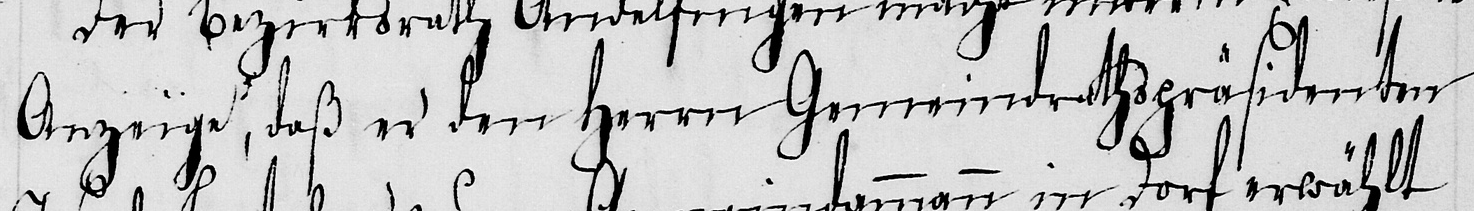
Anzeige, daß er den Herrn Gemeindrathspräsidenten
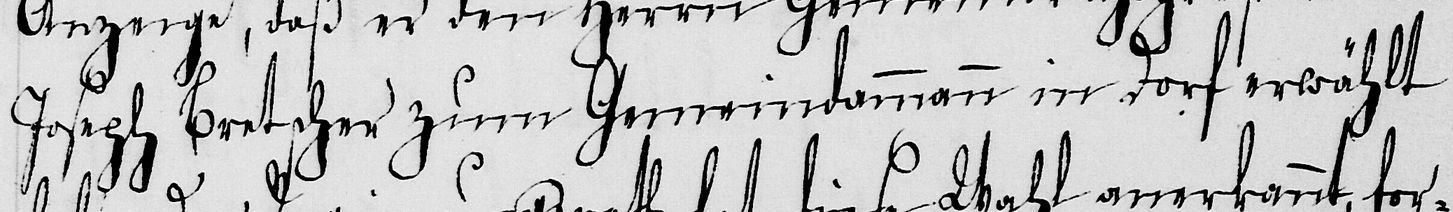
Joseph Bretscher zum Gemeindammann in Dorf erwählt
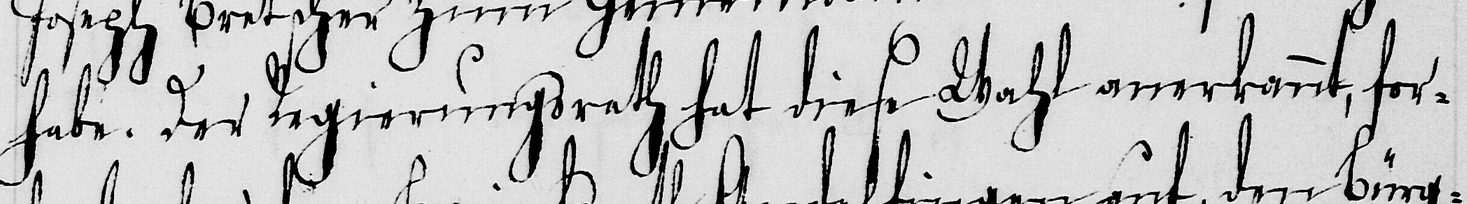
habe. Der Regierungsrath hat diese Wahl anerkannt, for¬
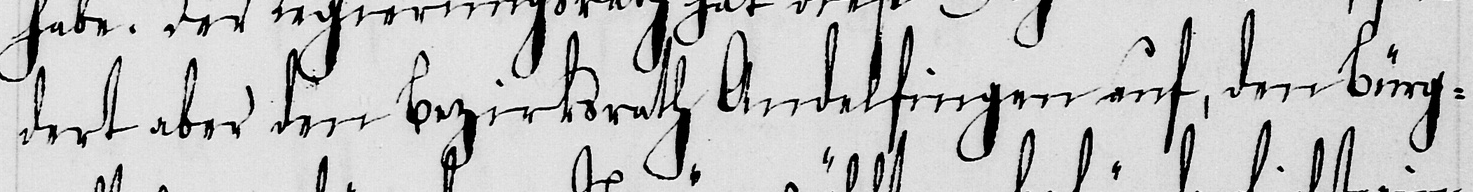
dert aber den Bezirksrath Andelfingen auf, den Bürg¬
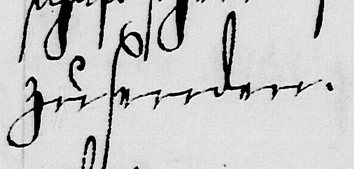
zusenden.
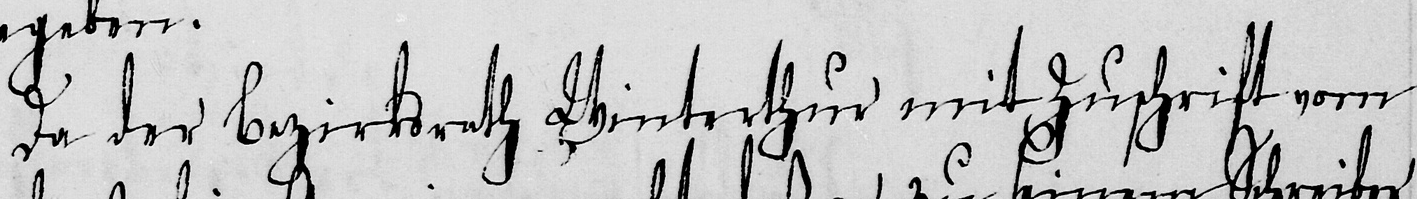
Da der Bezirksrath Winterthur mit Zuschrift vom
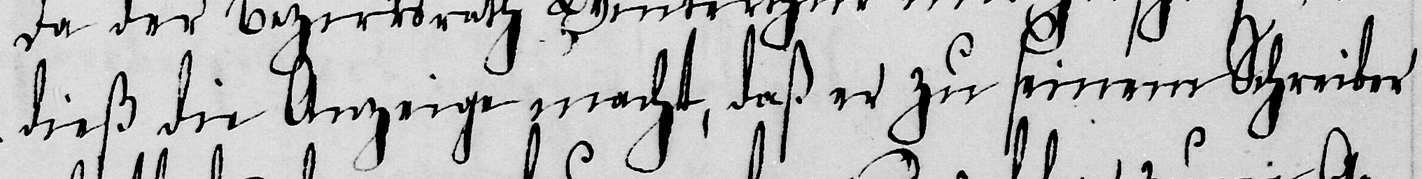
dieß die Anzeige macht, daß er zu seinem Schreiber
